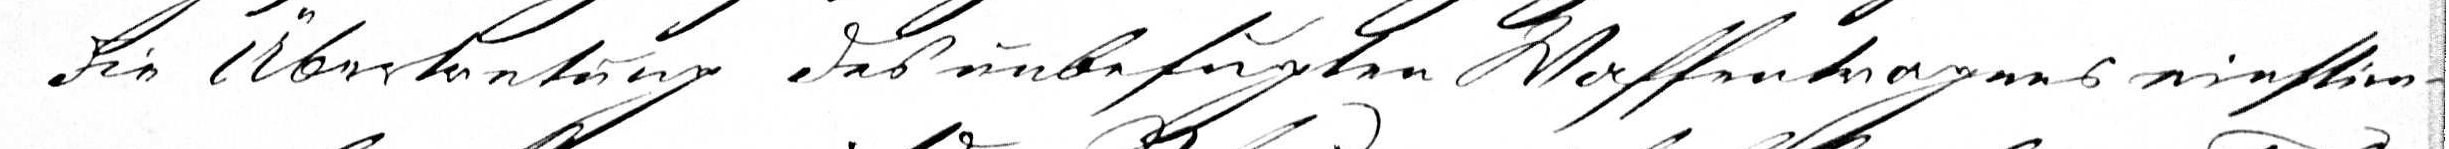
die Übertretung des unbefugten Waffentragens einstim¬
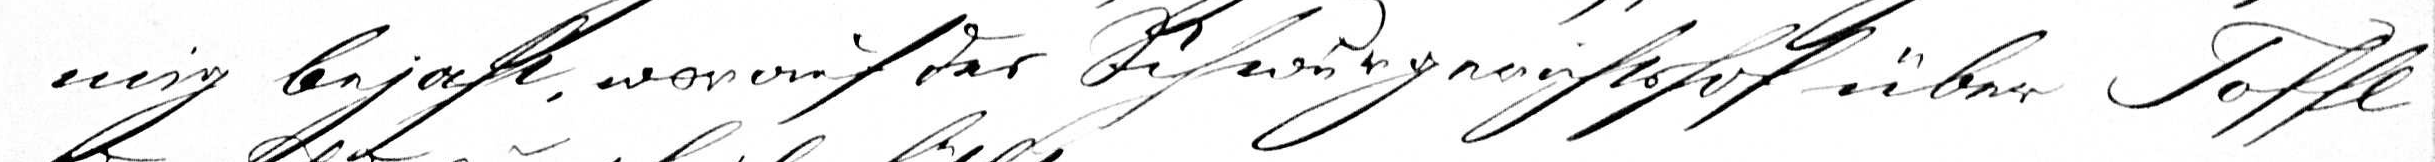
mig bejaht, worauf der Schwurgerichtshof über Toffl
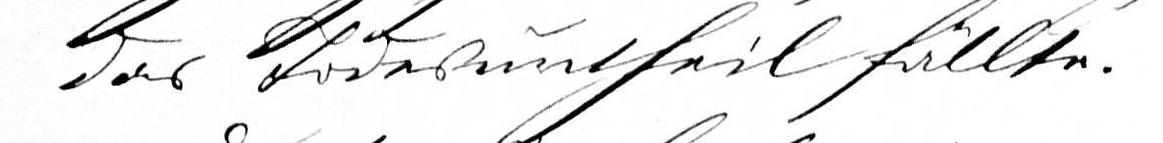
das Todesurtheil fällte.
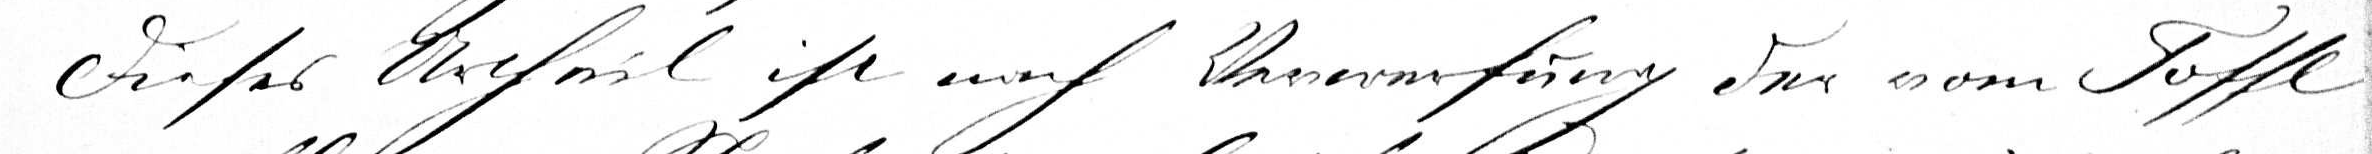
Dieses Urtheil ist nach Verwerfung der vom Toffl
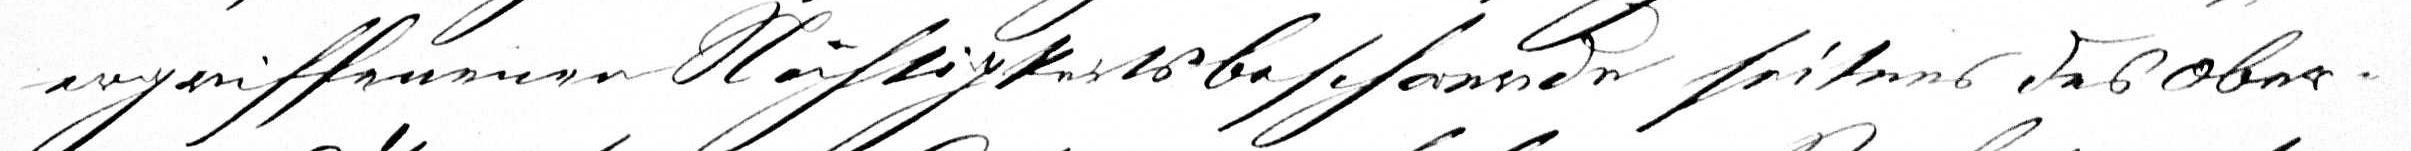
ergriffenener Nichtigkeitsbeschwerde seitens des Ober¬
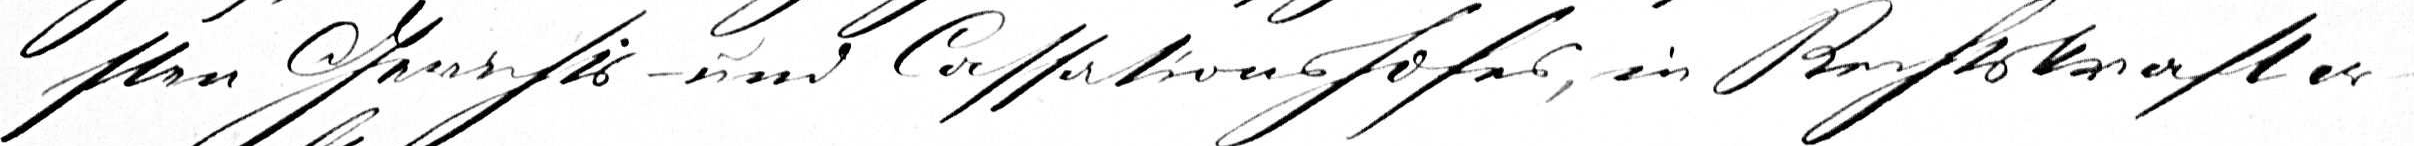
sten Gerichts- und Cassationshofes in Rechtskraft er¬
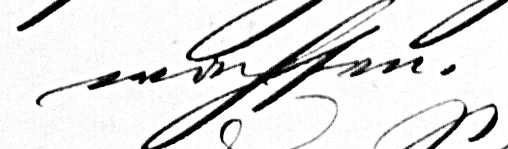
wachsen.
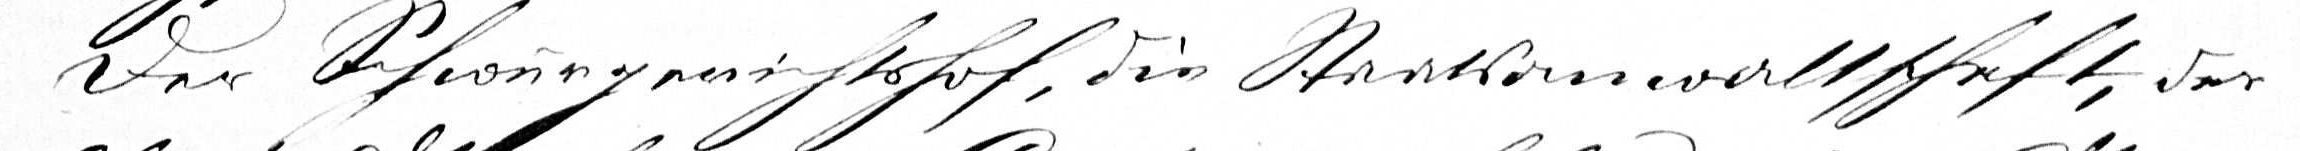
Der Schwurgerichtshof, die Staatsanwaltschaft, der
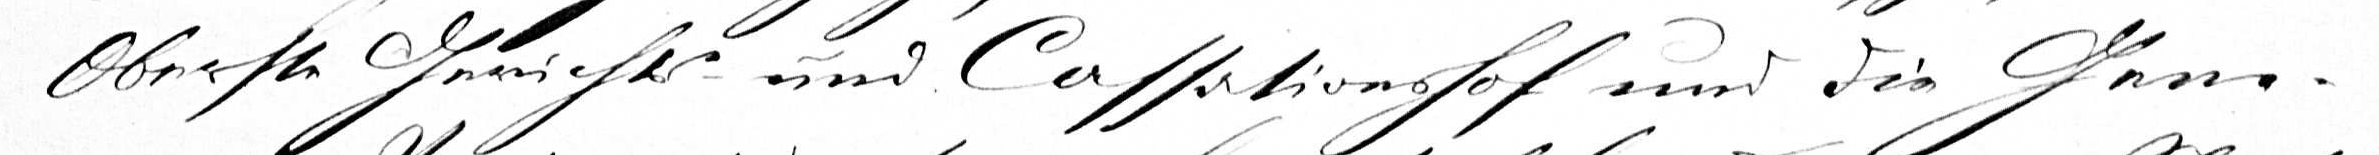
Oberste Gerichts- und Cassationshof und die Gene¬
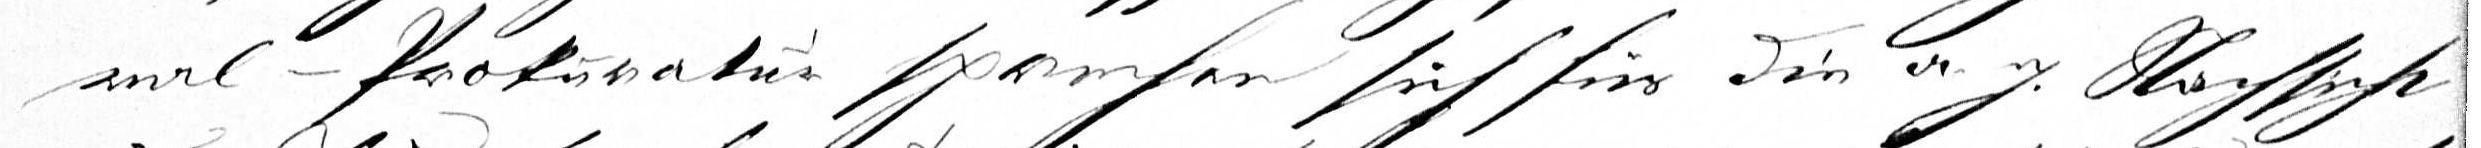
ral-Prokuratur sprachen sich für die a.g. Nachsicht
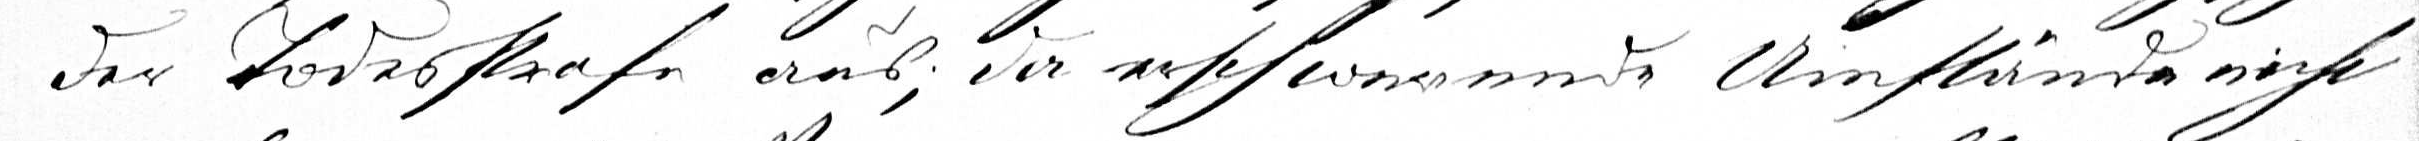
der Todesstrafe aus, da erschwerende Umstände nicht
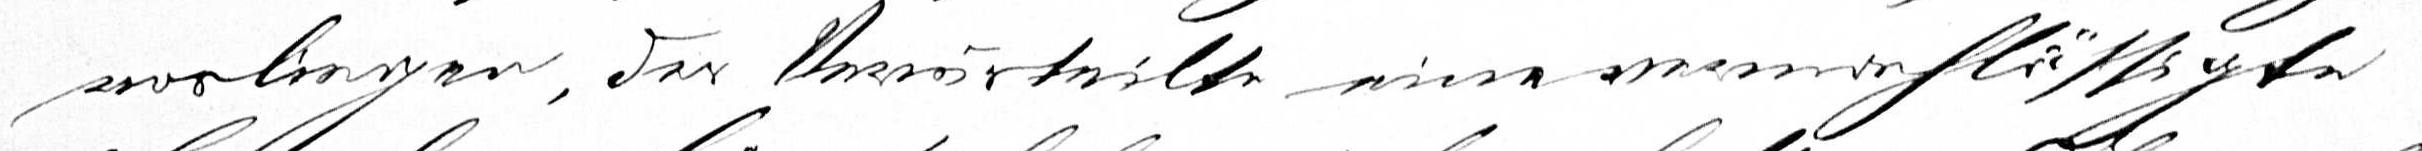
vorliegen, der Verurtheilte eine vernachlässigte
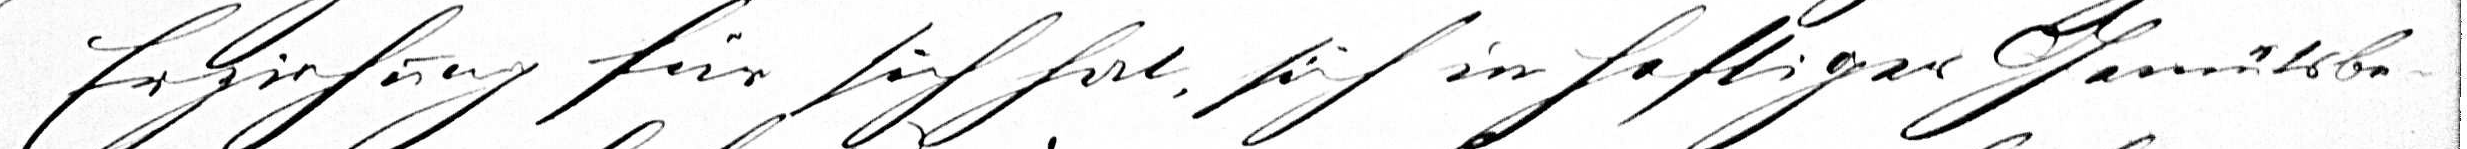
Erziehung für sich hat, sich in hefitger Gemüthsbe¬
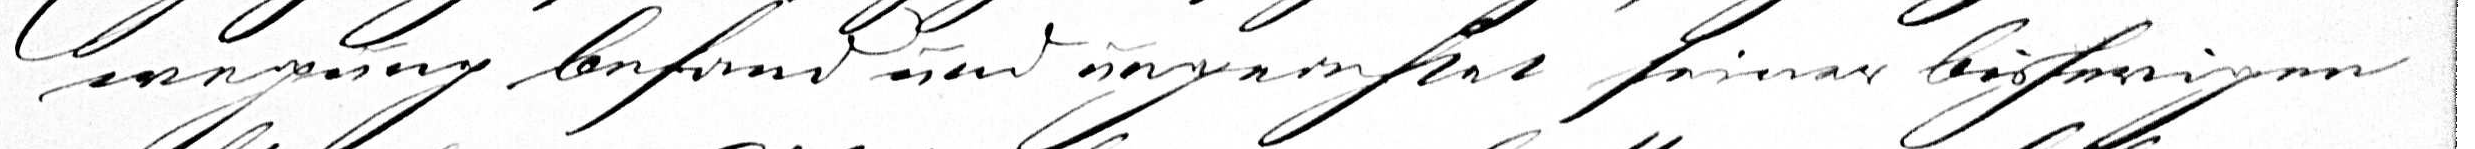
wegung befand und ungeachtet seiner bisherigen
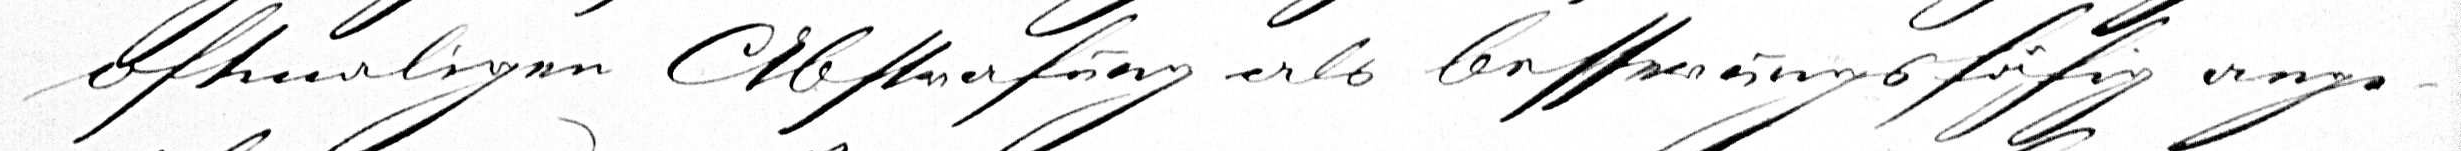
oftmaligen Abstrafung als besserungsfähig ange¬
